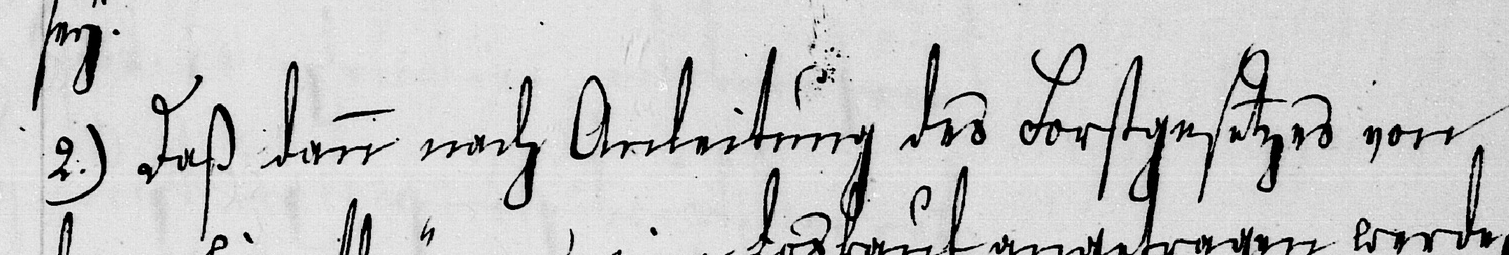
2.) Daß dann nach Anleitung des Forstgesetzes von
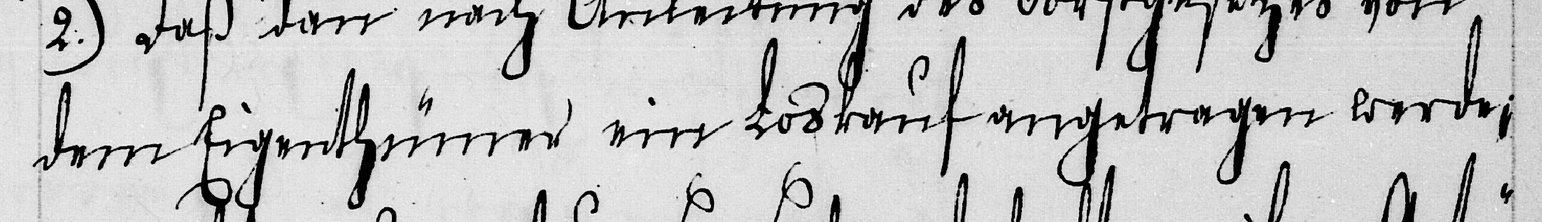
dem Eigenthümer ein Loskauf angetragen werde;
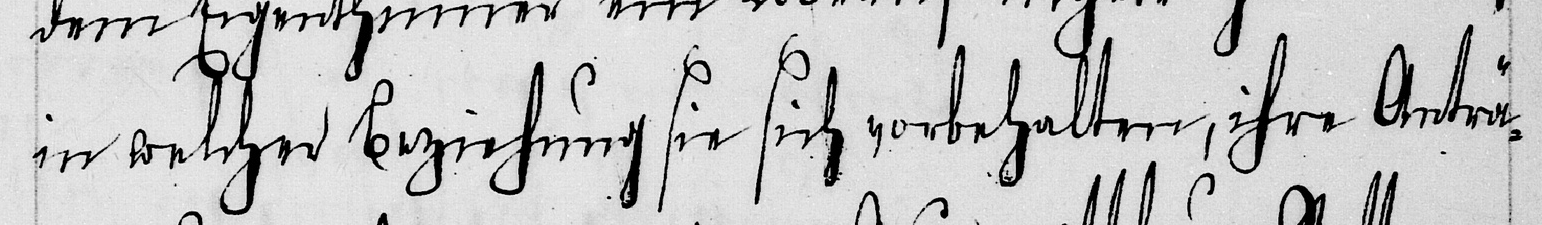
in welcher Beziehung sie sich vorbehalten, ihre Anträ¬
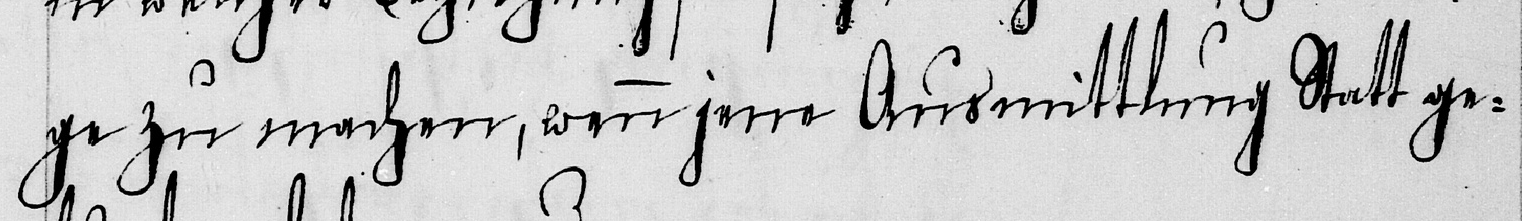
ge zu machen, wenn jene Ausmittlung Statt ge¬
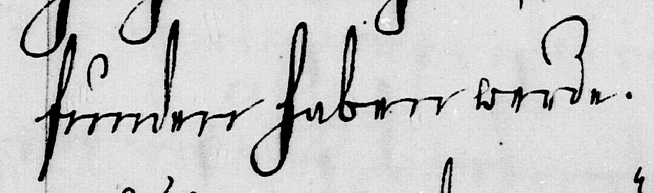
funden haben werde.
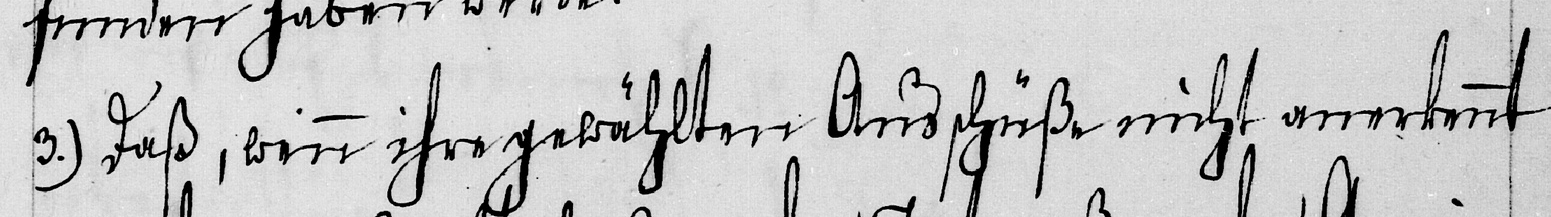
3.) Daß, wenn ihre gewählten Ausschüße nicht anerkannt
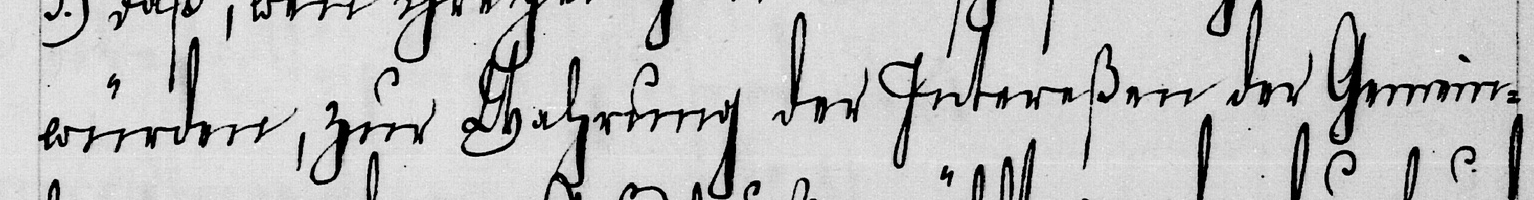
würden, zur Wahrung der Intereßen der Gemein¬
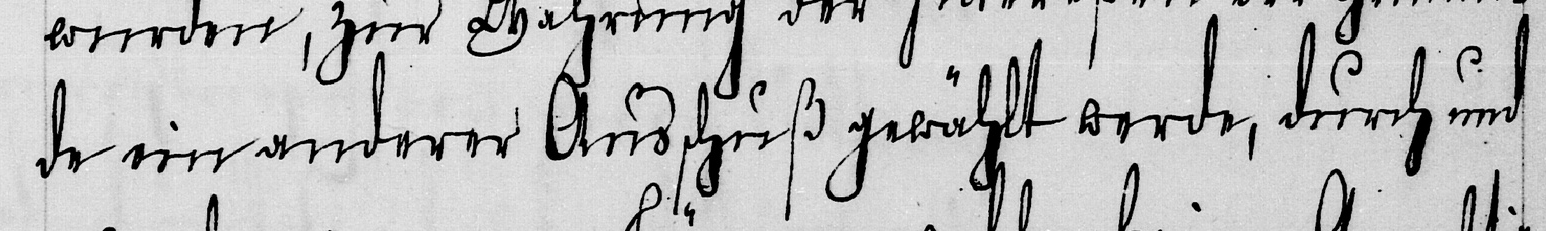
de ein anderer Ausschuß gewählt werde, durch und
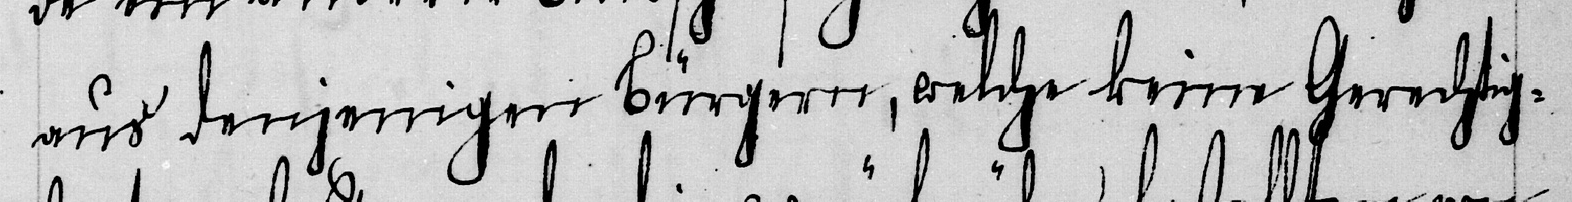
aus denjenigen Bürgern, welche keine Gerechtig¬
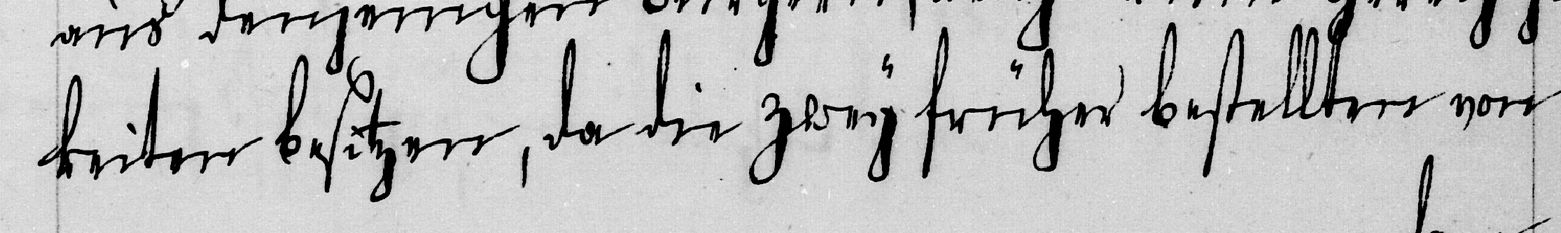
keiten besitzen, da die zwey früher bestellten von
